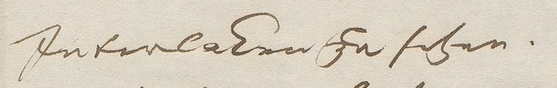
Interlaken zu sehen.
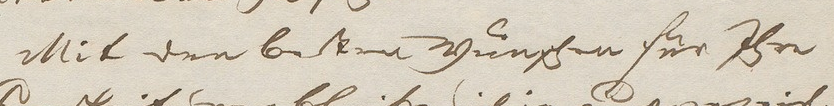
Mit den besten Wünschen für Ihre
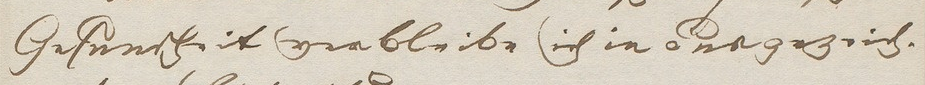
Gesundheit verbleibe ich in ausgezeich-
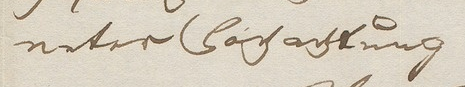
neter Hochachtung
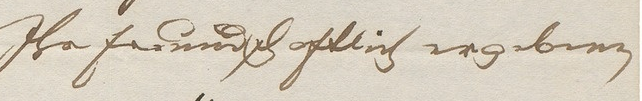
Ihr freundschaftlich ergebene
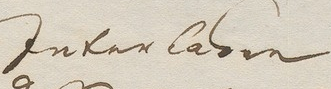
Interlaken
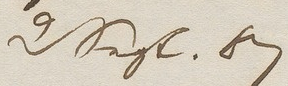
9 Sept. 67
